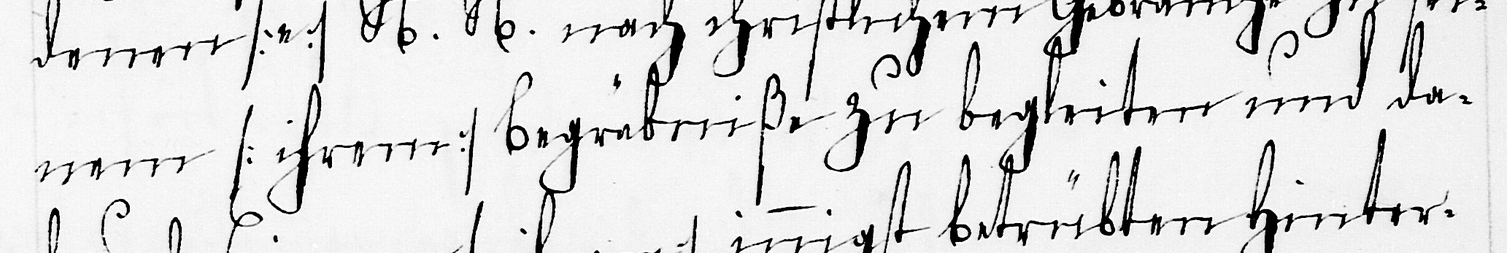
nem [ihrem] Begräbniße zu begleiten und da¬
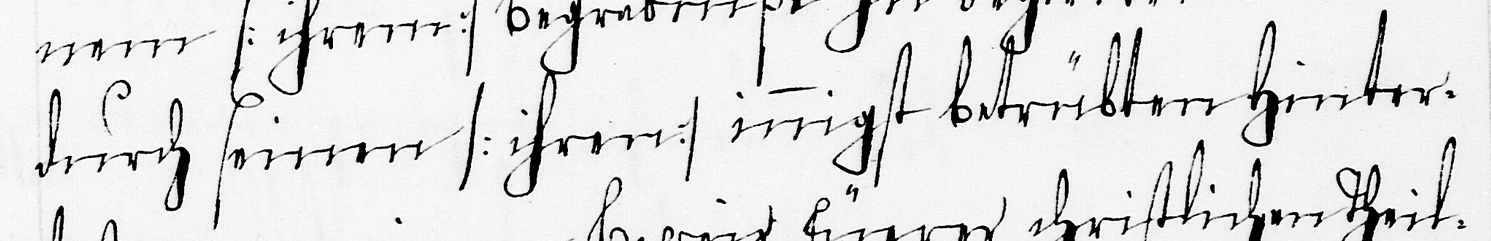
durch seinen [ihren] innigst betrübten Hinter¬
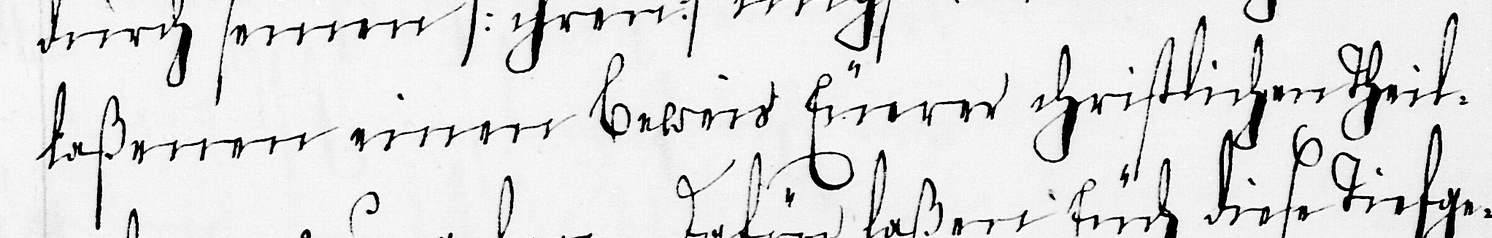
laßenen einen Beweis Euerer christlichen Theil¬
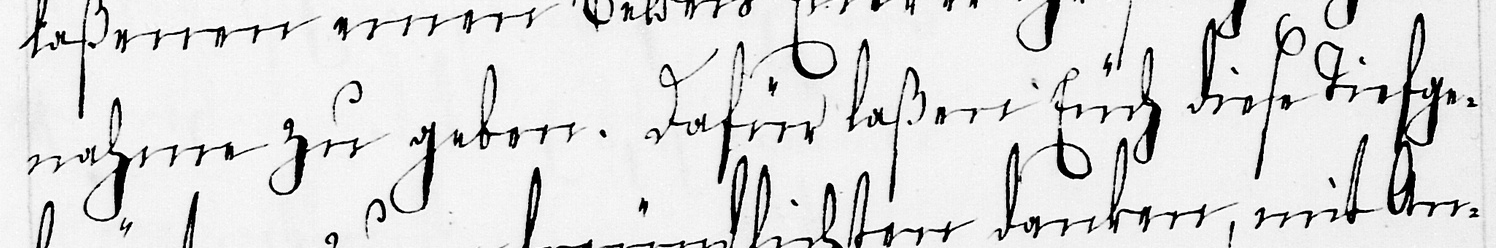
nahme zu geben. Dafür laßen Euch diese Tiefge¬
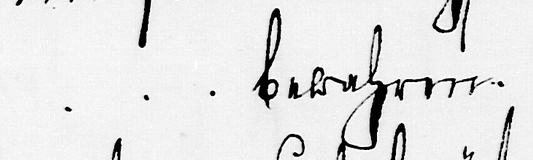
… bewahren.
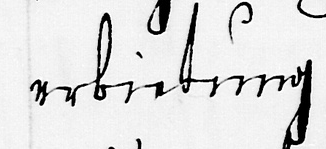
erbietung
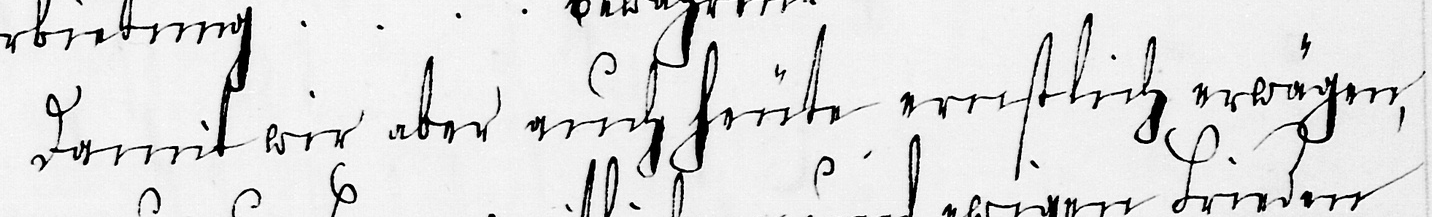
Damit wir aber auch heute ernstlich erwägen,
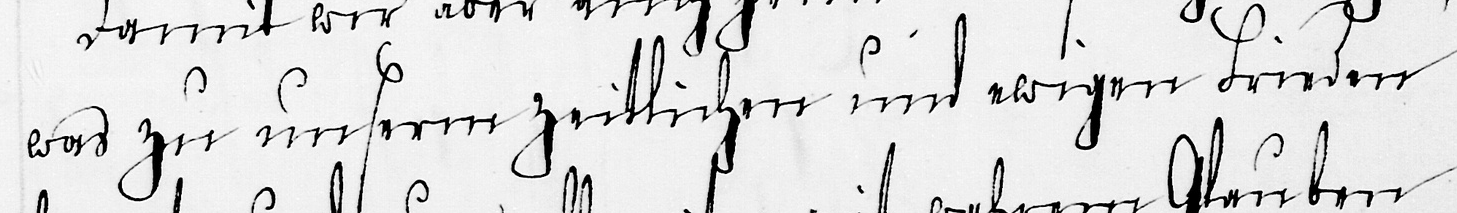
was zu unserm zeitlichen und ewigen Leieden
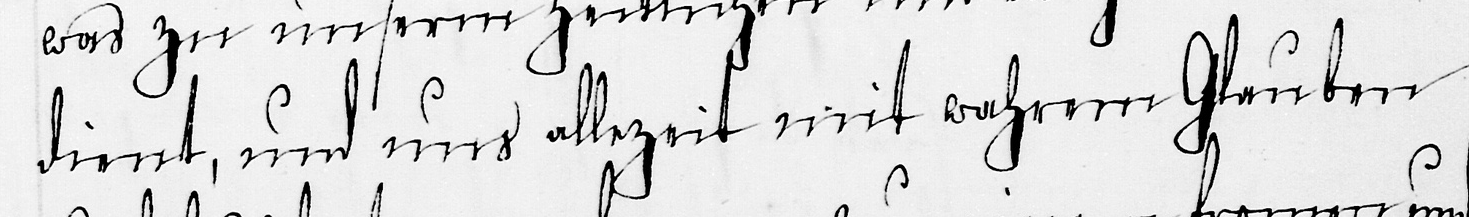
dient, und uns allezeit mit wahrem Glauben
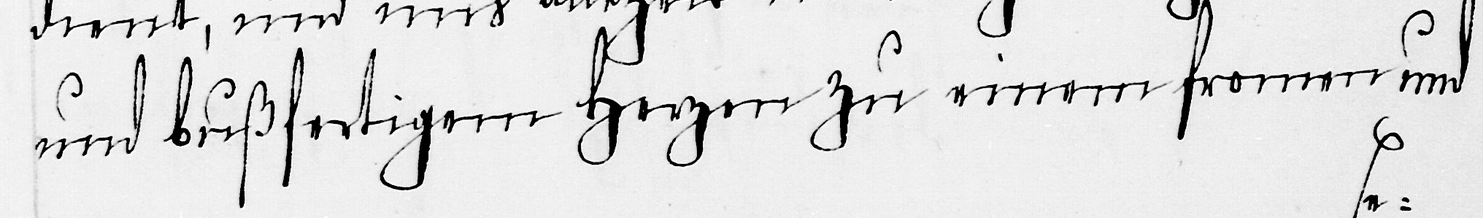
und bußfertigem Herzen zu einem fromen und
